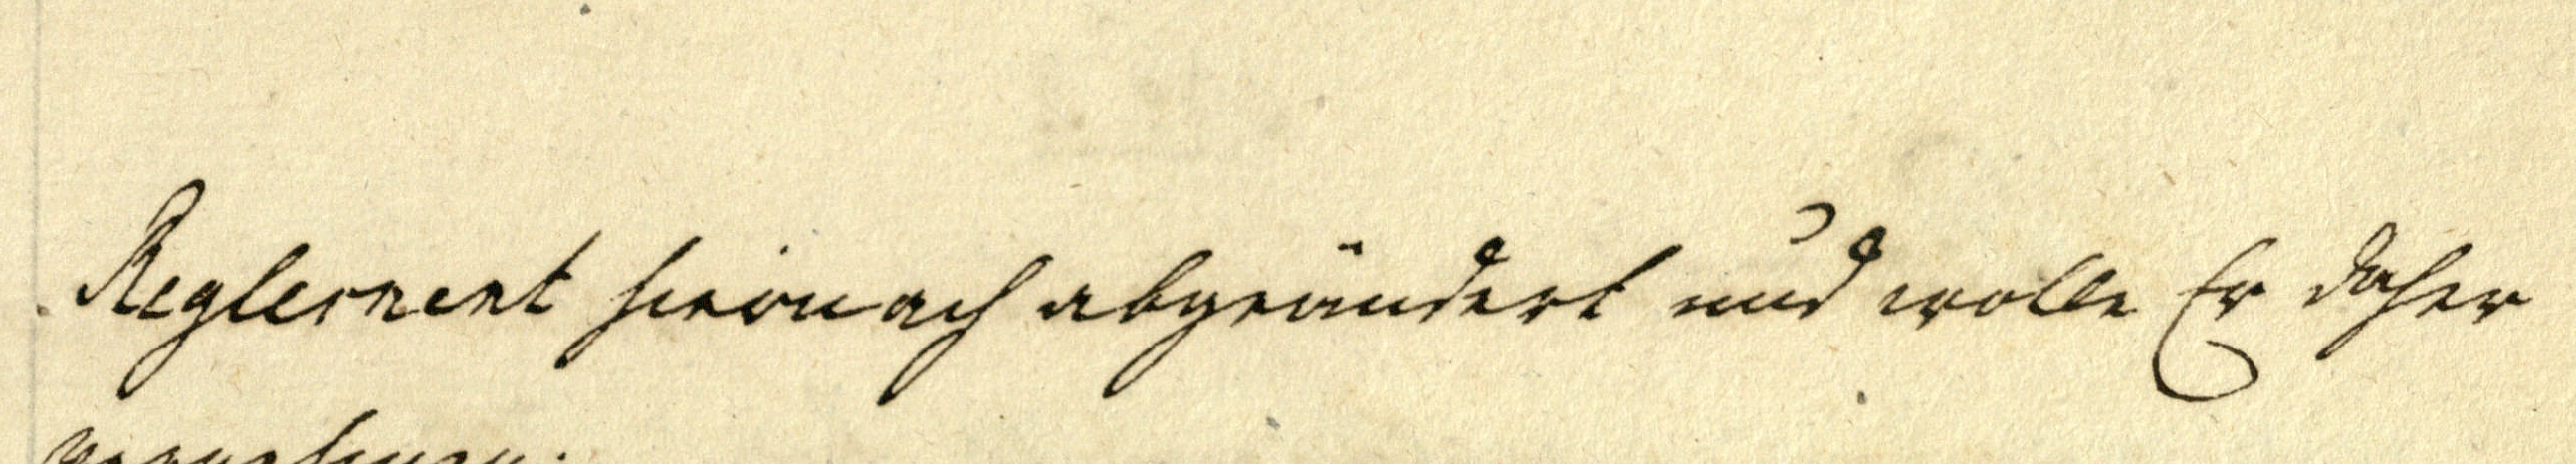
Reglement hiernach abgeändert und wolle Er daher
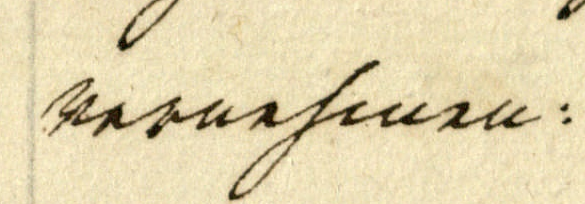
vernehmen:
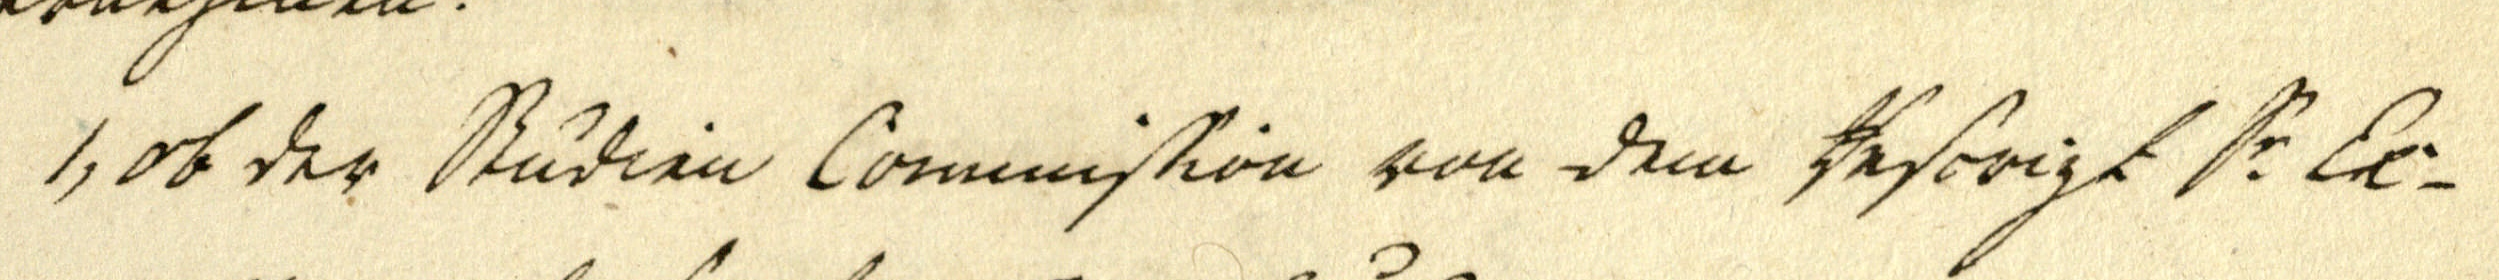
1, ob der Studien Commission von dem Rescript Sr. Ex¬
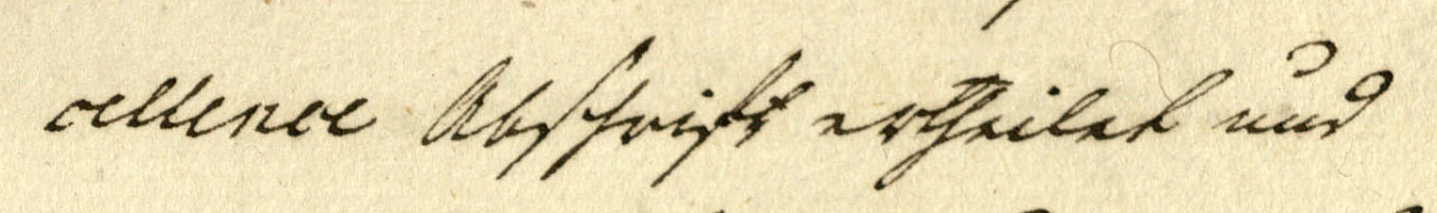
cellence Abschrift ertheilet und
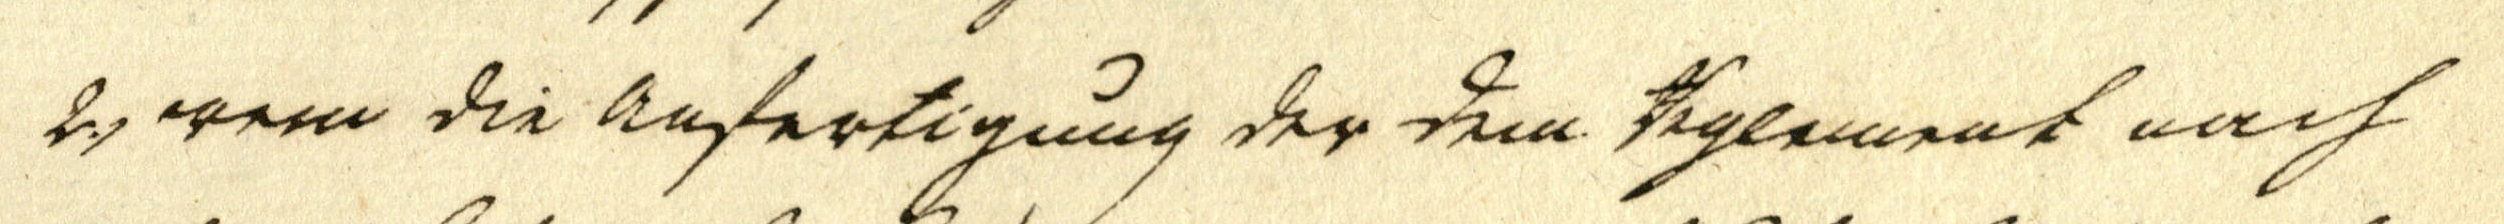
2., wem die Anfertigung der dem Reglement nach
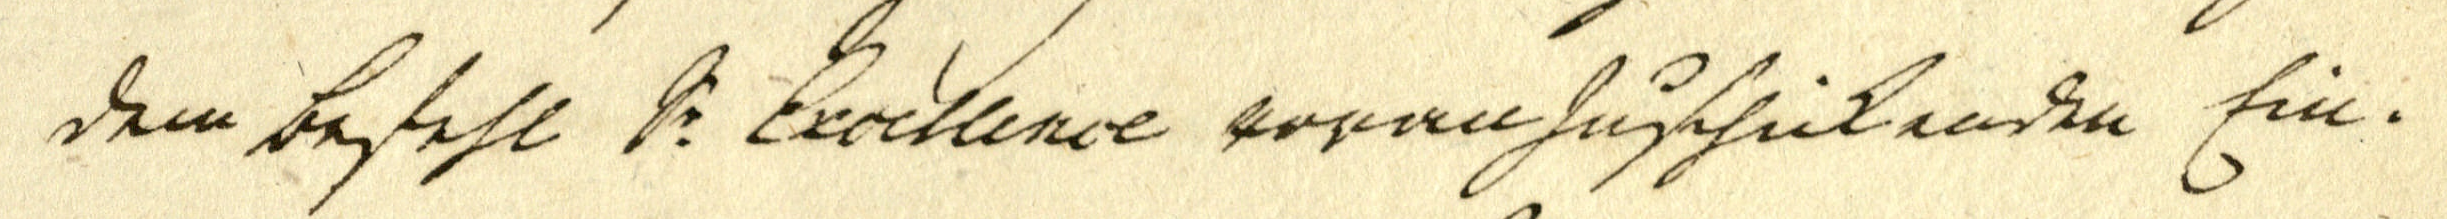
dem Befehl Sr. Excellence voran zuschickenden Ein¬
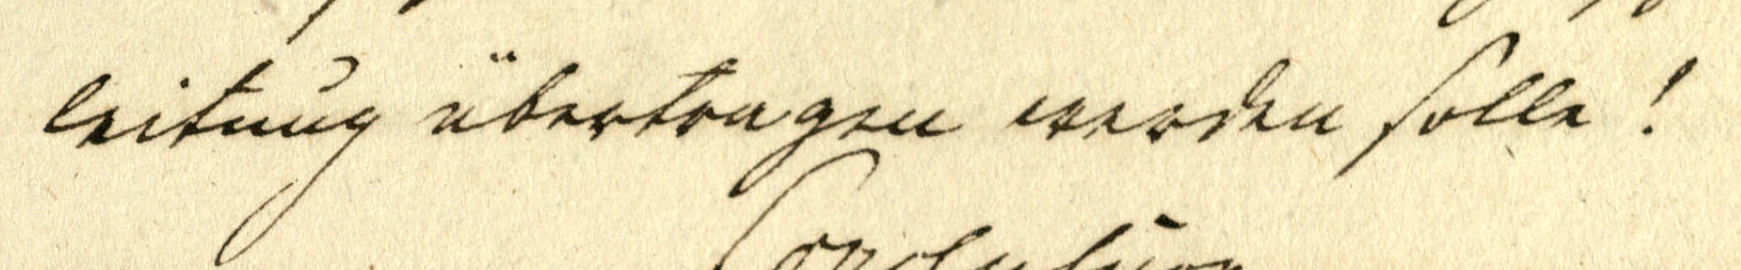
leitung übertragen werden solle!
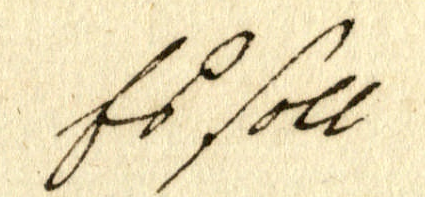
Es soll
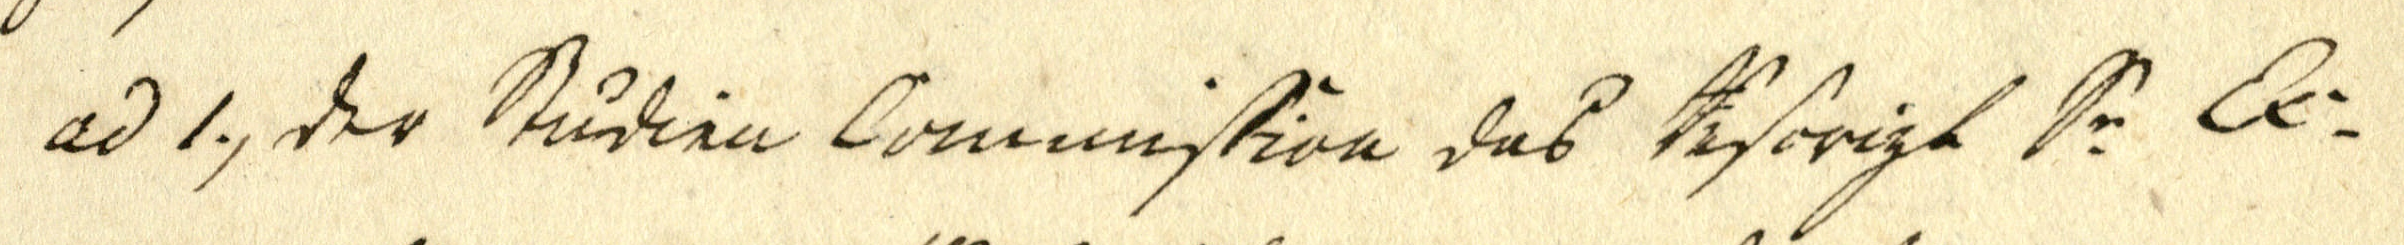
ad 1., der Studien Commission das Rescript Sr. Ex¬
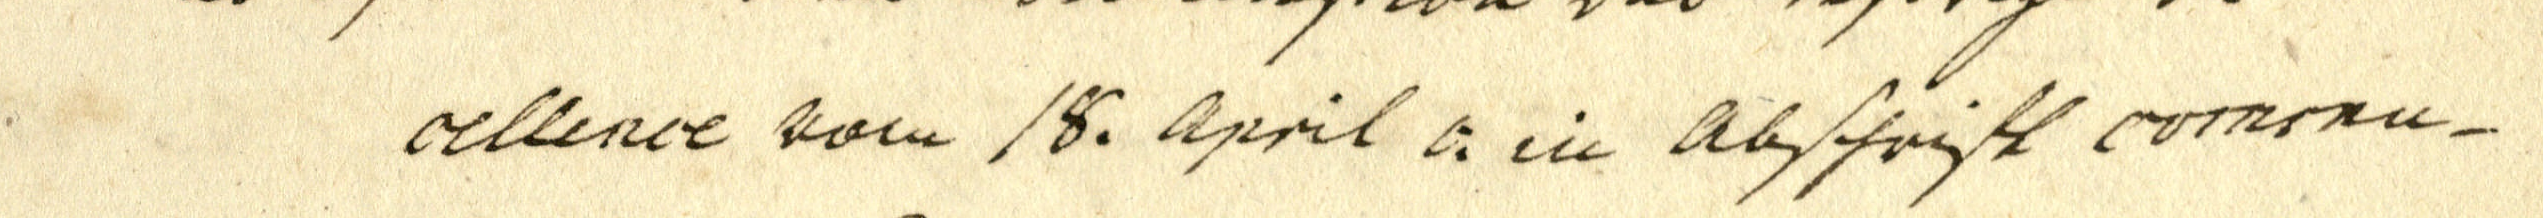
cellence vom 18. April c. in Abschrift commu¬
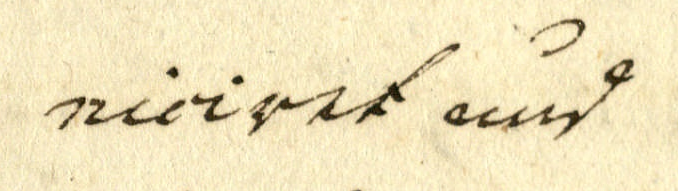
niciret und
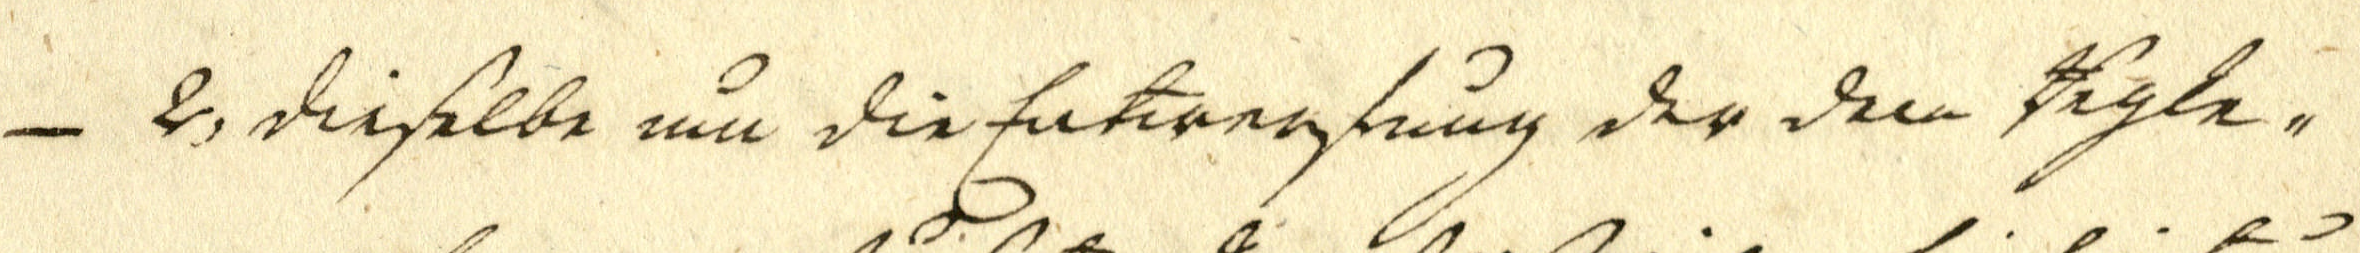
2, dieselbe um die Entwerfung der dem Regle¬
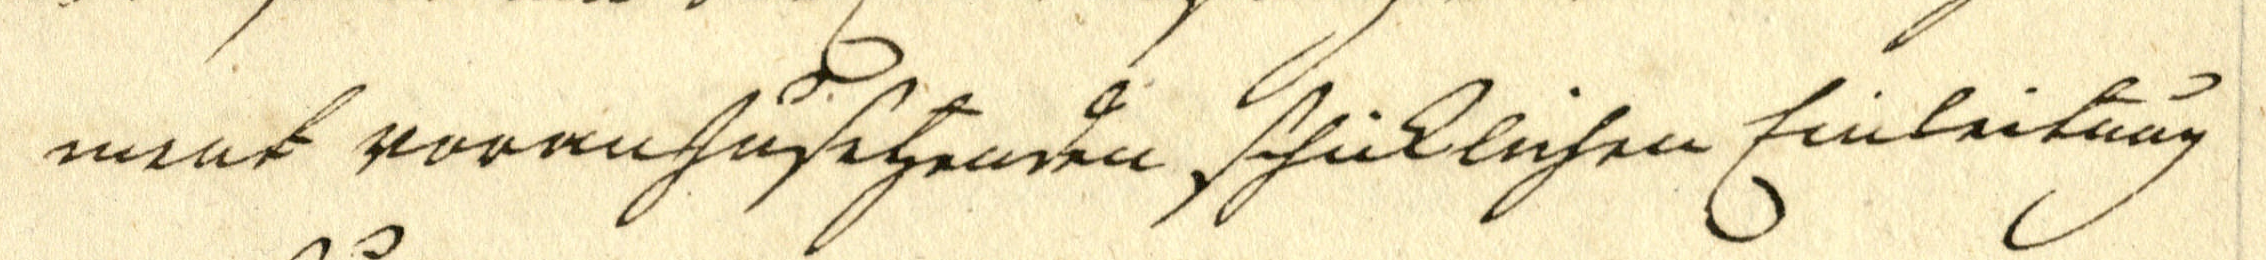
ment voranzusetzenden schicklichen Einleitung
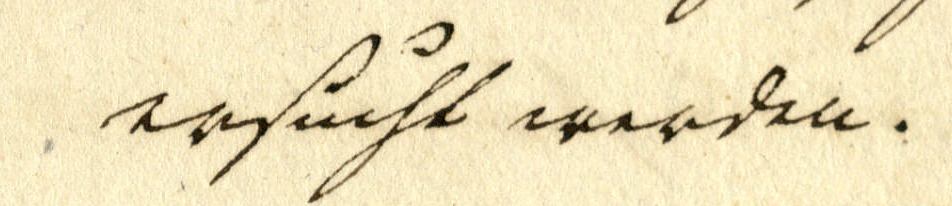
ersucht werden.
